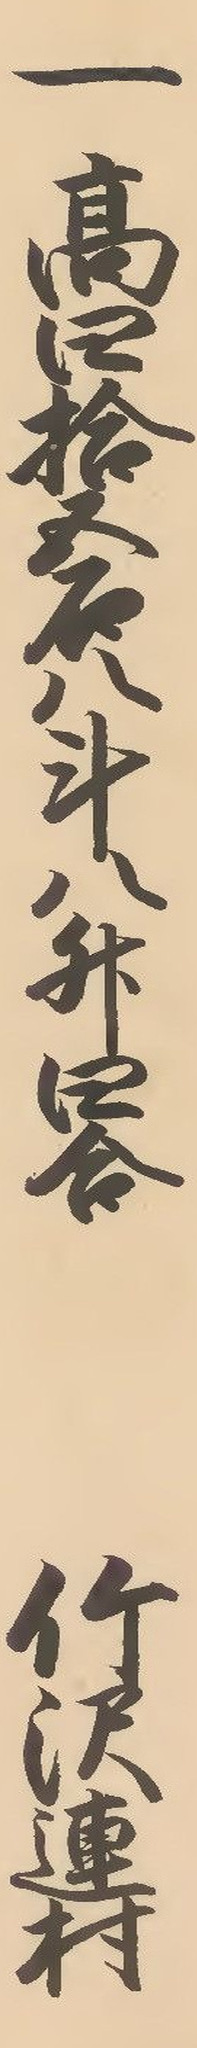一高四拾五石八斗八升四合竹沢連村
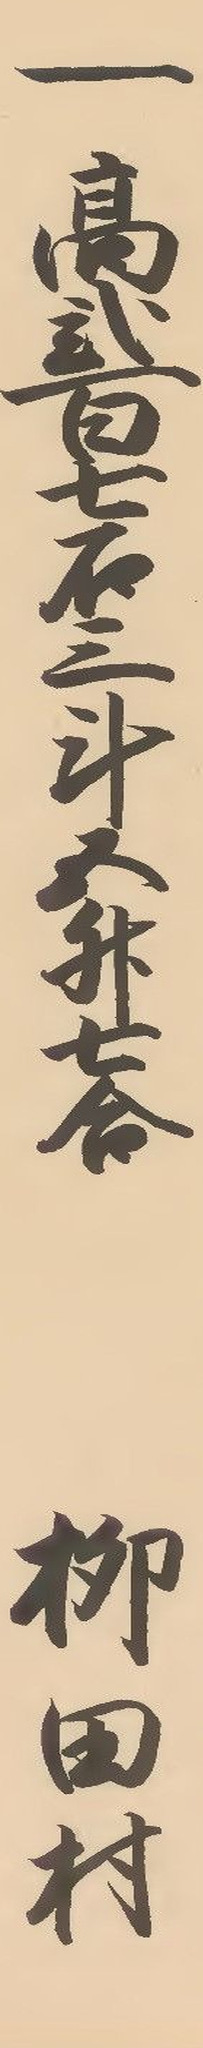一高弐百七石三斗五升七合柳田村
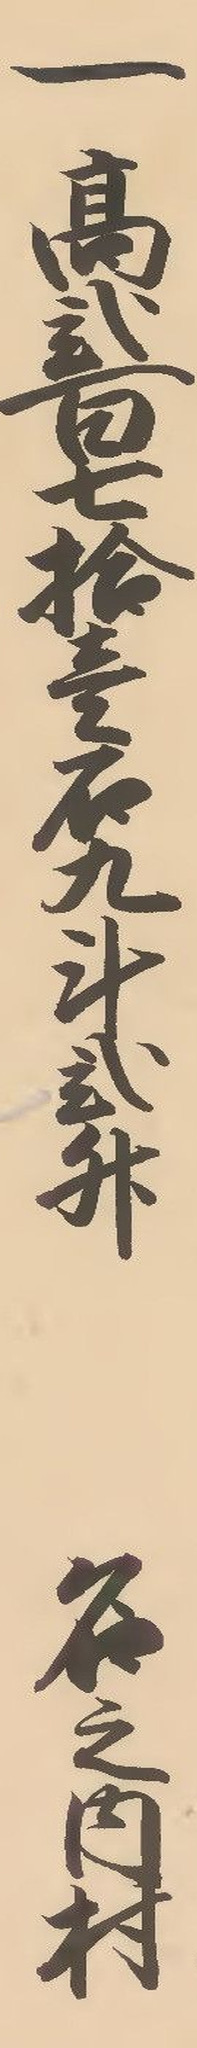一高弐百七拾壱石九斗弐升名之内村
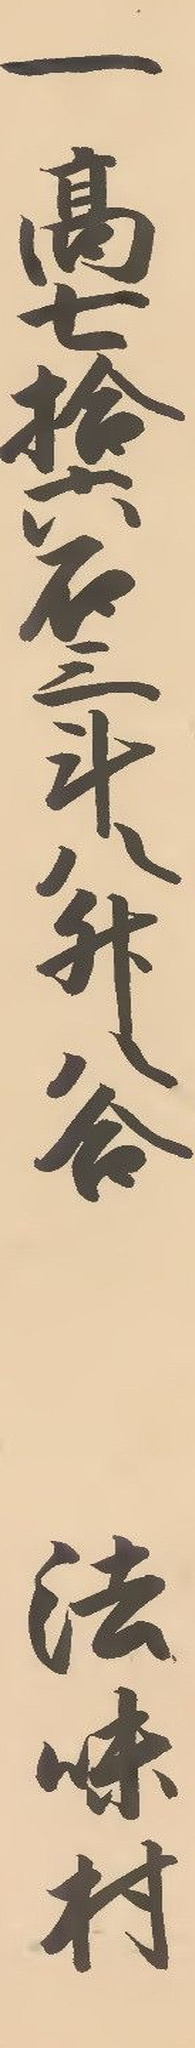一高七拾六石三斗八升八合法味村
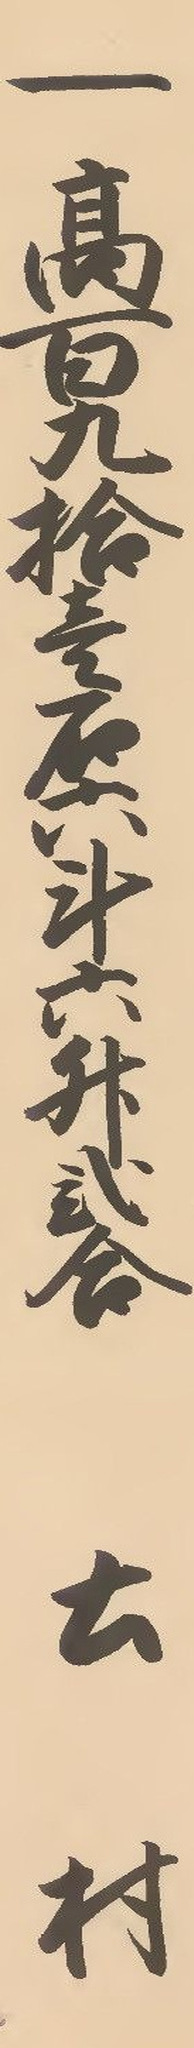一高百九拾壱石六斗六升弐合土村
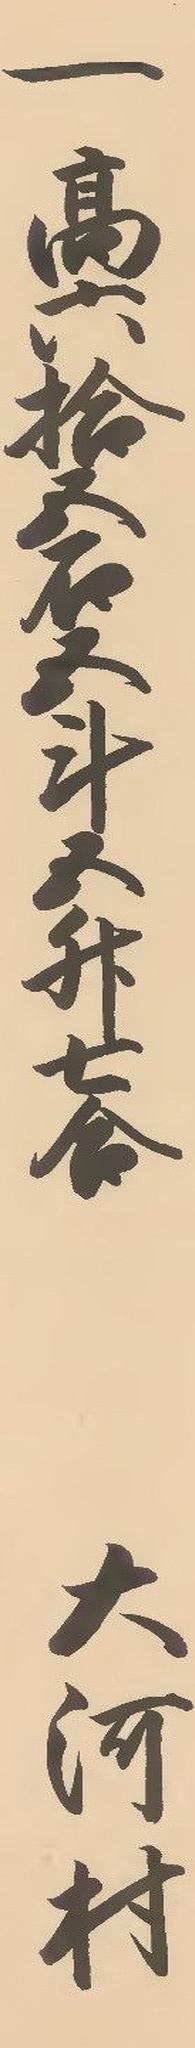一高六拾五石五斗五升七合大河村
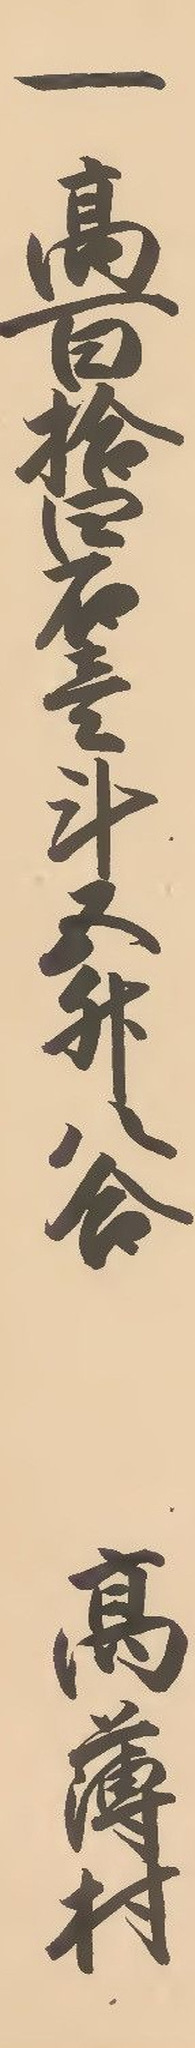一高百拾四石壱斗五升八合高薄村

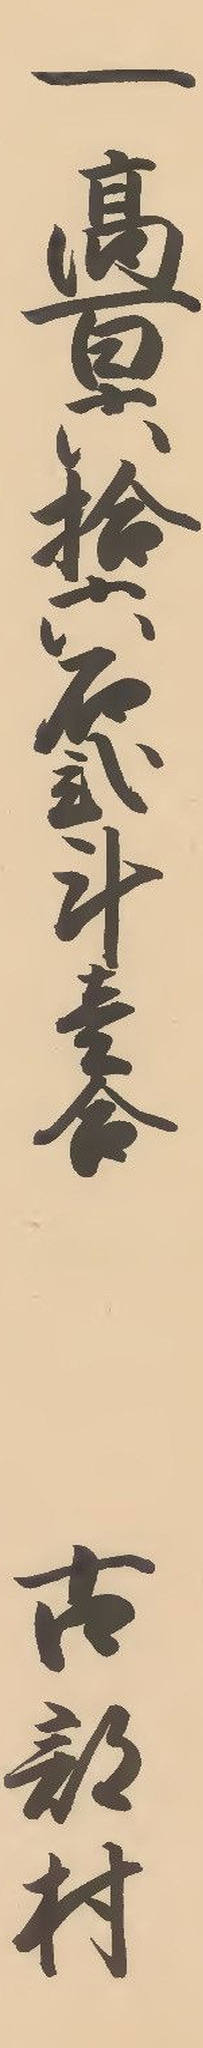一高百六拾六石弐斗壱合古部村
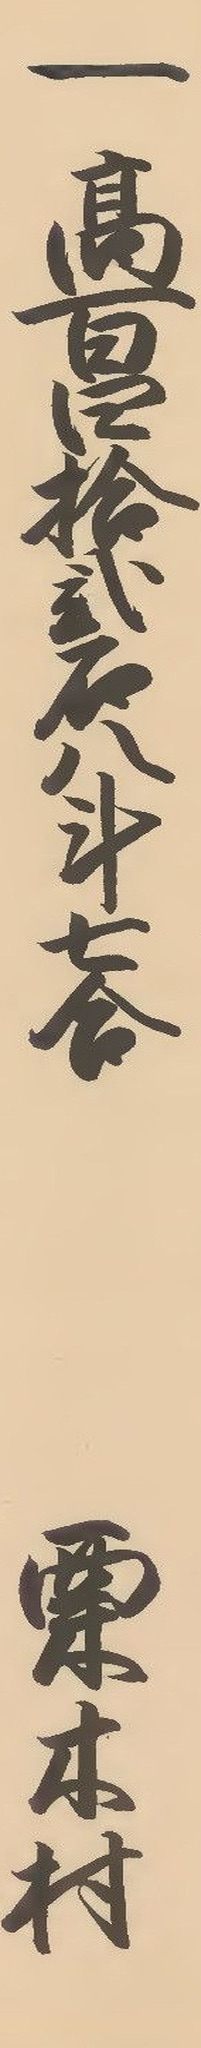一高百四拾弐石八斗七合栗木村
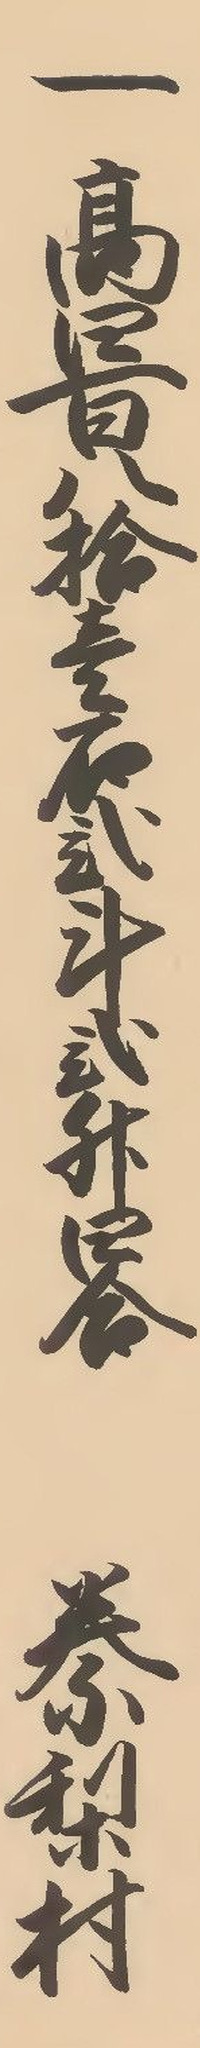一高四百八拾壱石弐斗弐升四合泰梨村
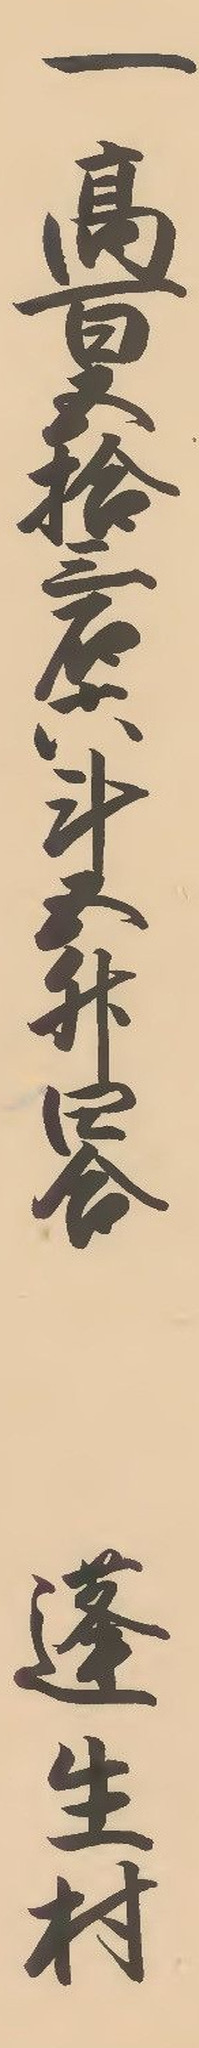一高百五拾三石六斗五升四合蓬生村
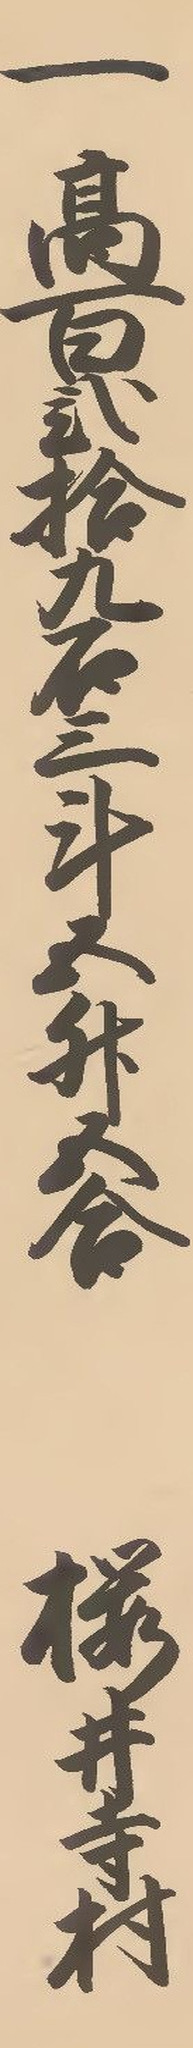一高百弐拾九石三斗五升五合桜井寺村
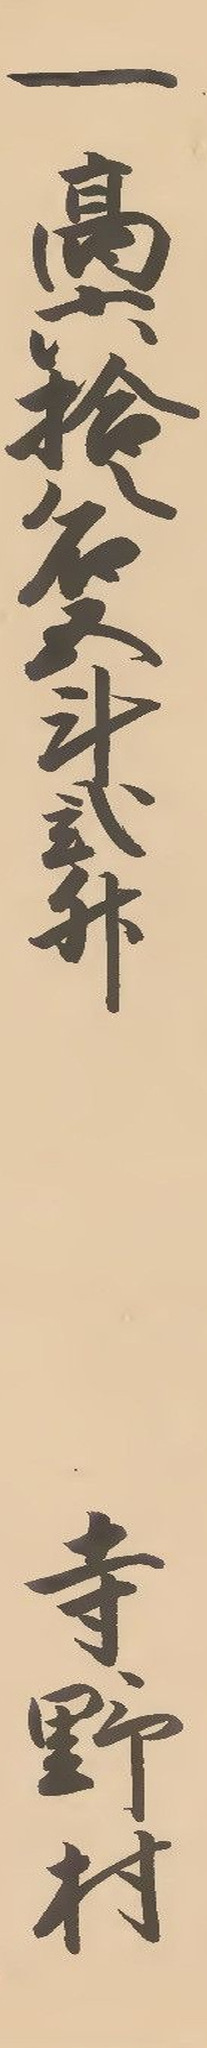一高六拾八石五斗弐升寺野村
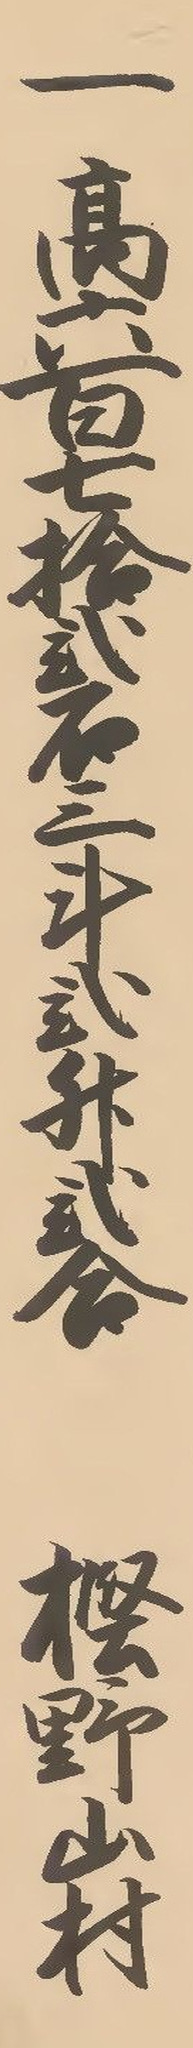一高六百七拾弐石三斗弐升弐合樫野山村
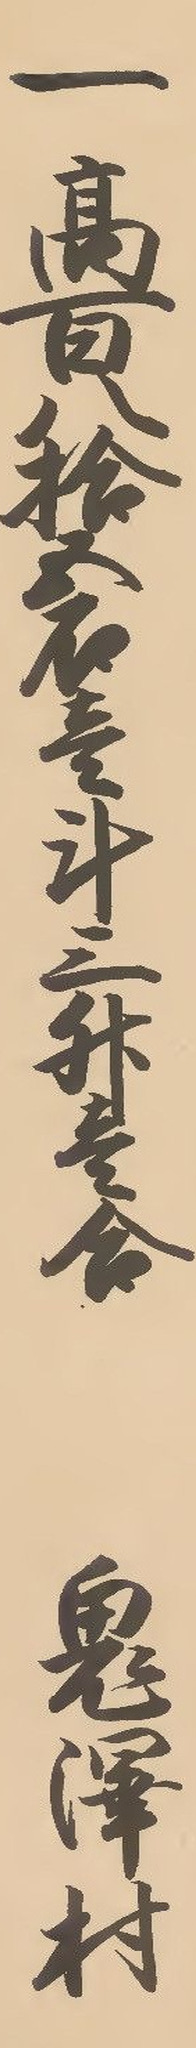一高百八拾五石壱斗三升壱合鬼沢村

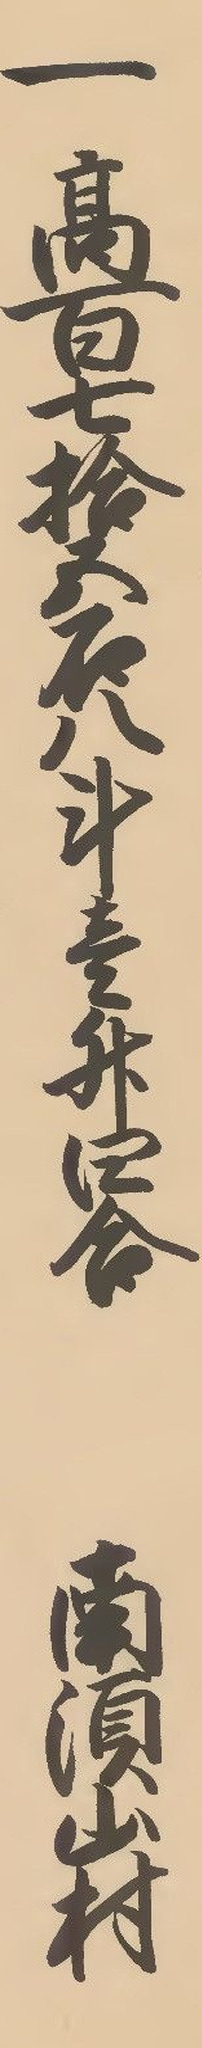一高百七拾五石八斗壱升四合南須山村
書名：三河国郷帳
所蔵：国立公文書館 National Archives of Japan
